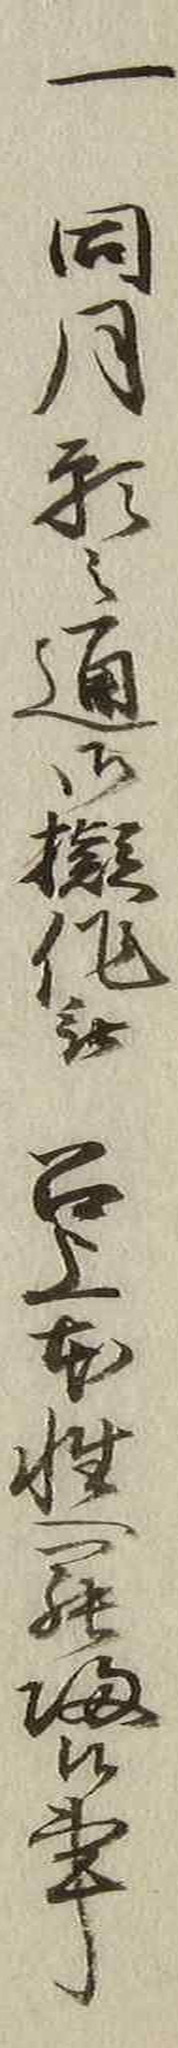一同月願之通御擬作被召上本性へ罷帰候事
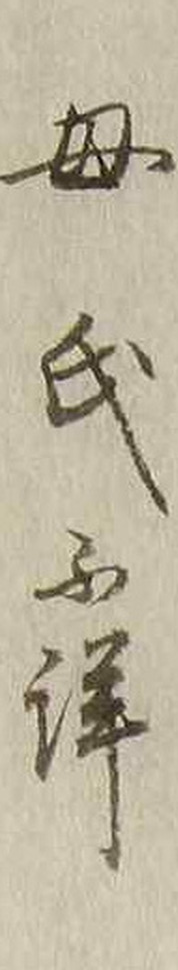母氏不詳
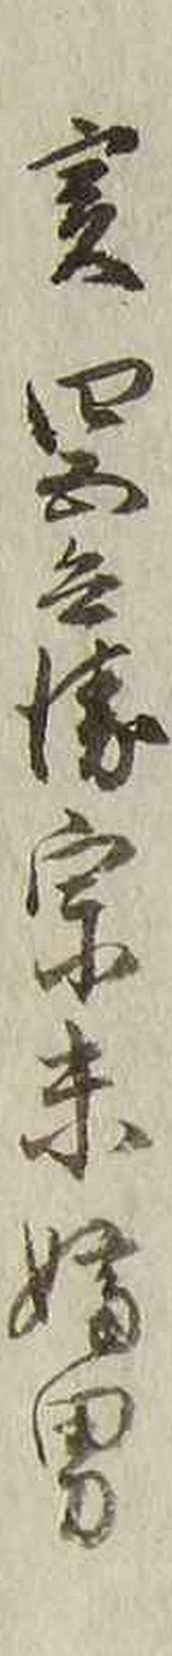実四五兵衛宗未嫡男

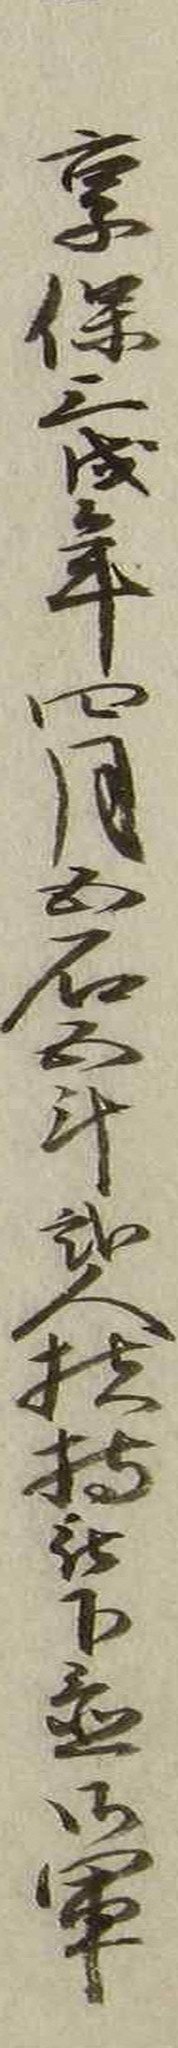一享保三戌年四月五石五斗弐人扶持被下置御軍
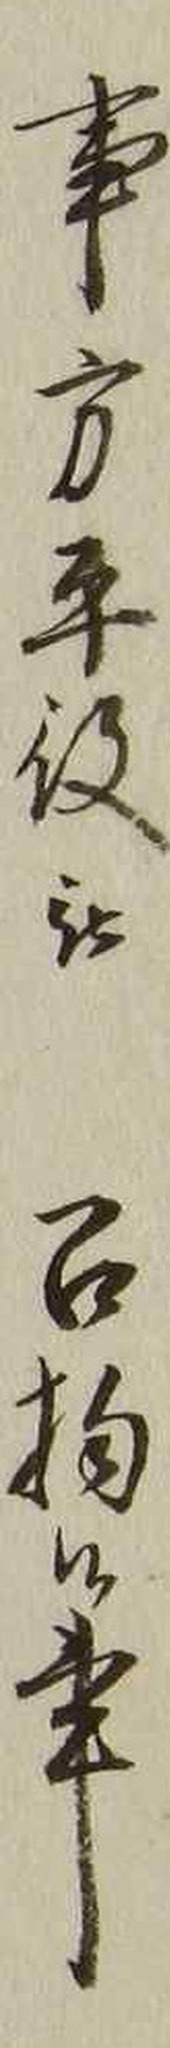事方平役被召抱候事
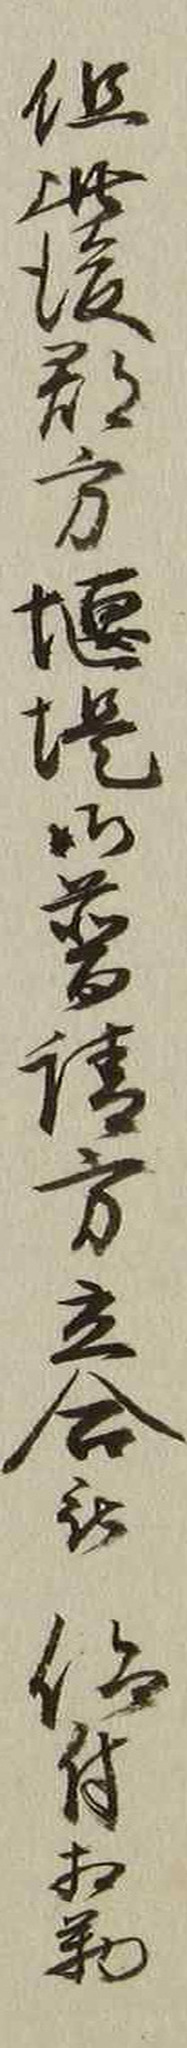但此後郡方堰堤御普請方立合被仰付相勤
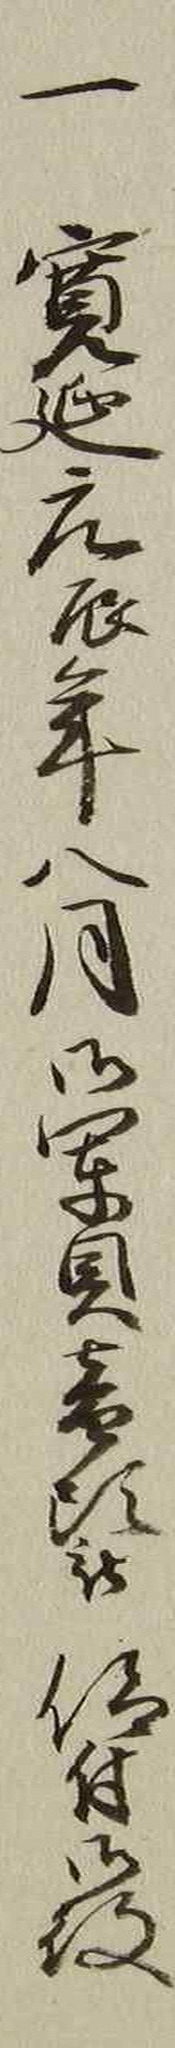一寛延元辰年八月御軍貝音頭被仰付御役
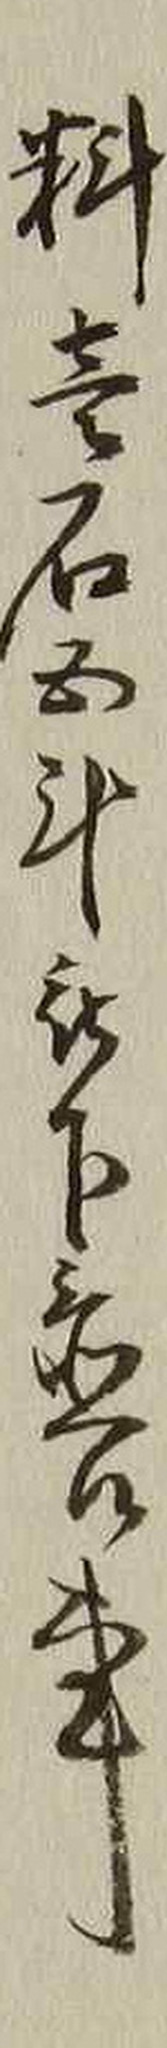料壱石五斗被下置候事
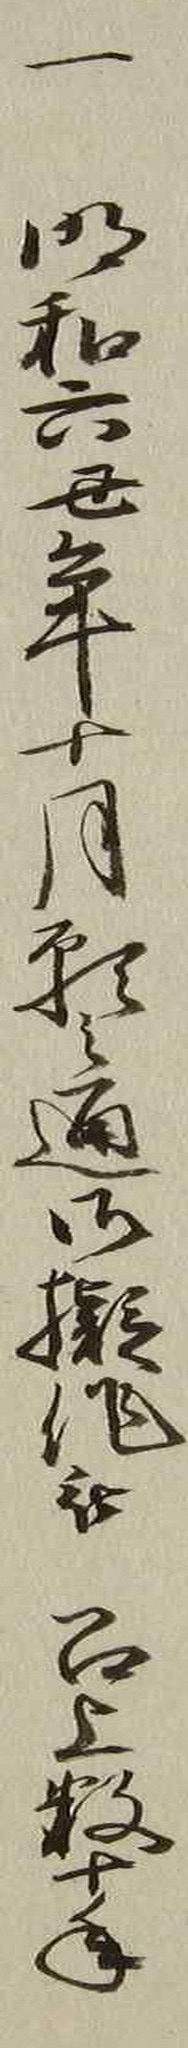一明和六丑年十月願之通御擬作被召上数十年
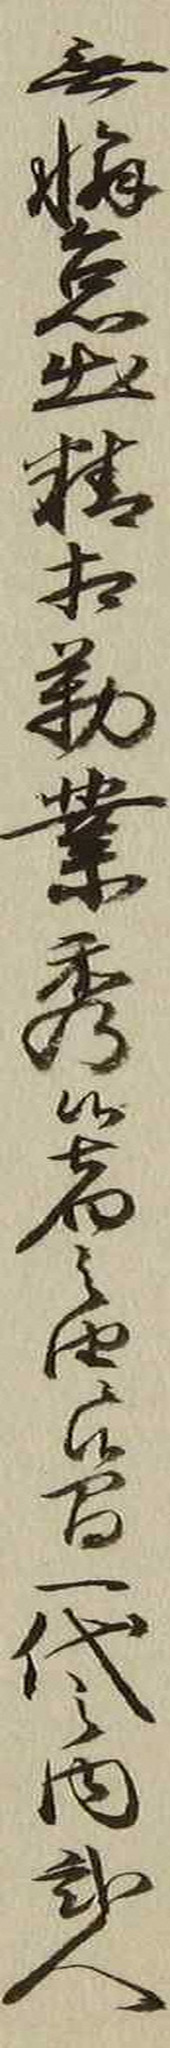無懈怠出精相勤業秀候者之由ニ候間一代之内弐人
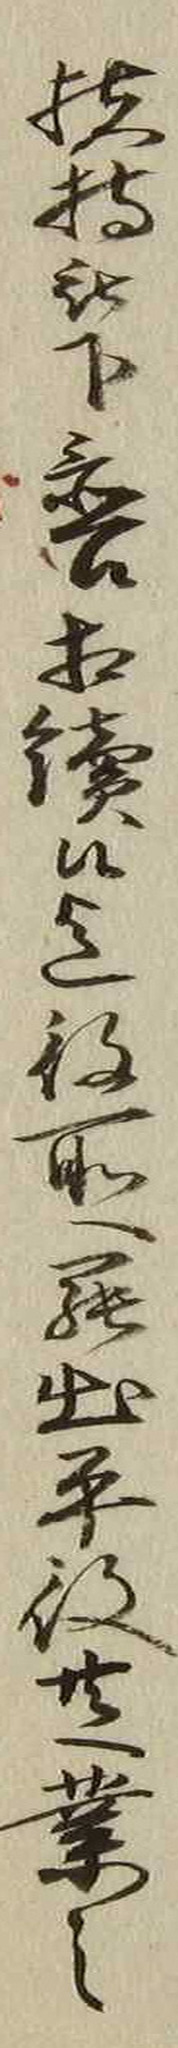扶持被下置候相続候迄役所へ罷出平役共へ業之
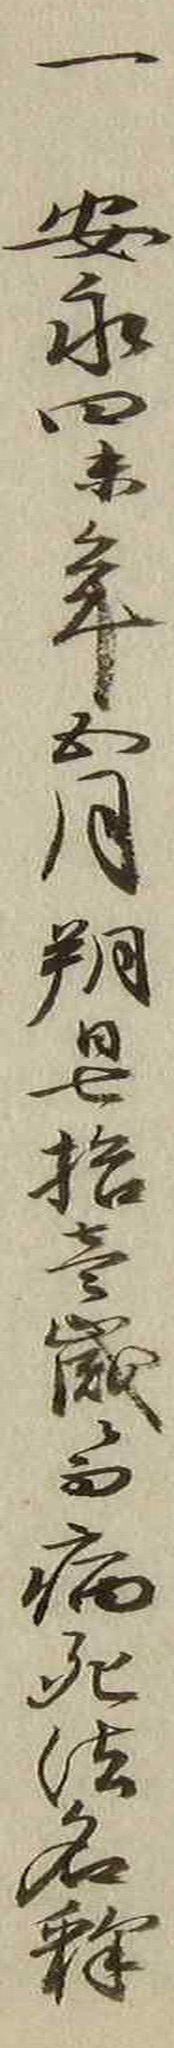一安永四未年五月朔日七拾壱歳ニ而病死法名釈
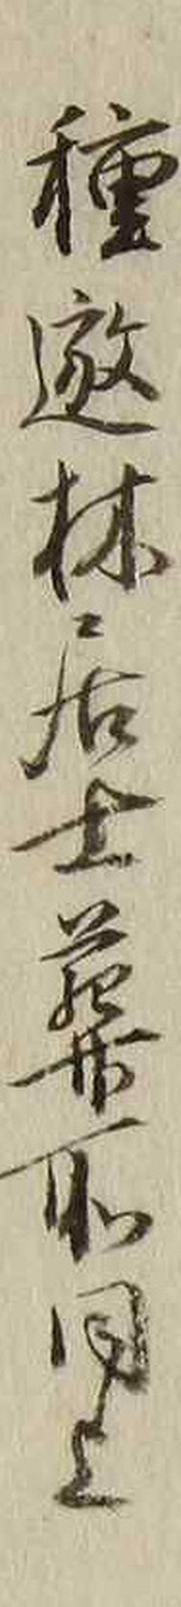種遊林居士葬所同上
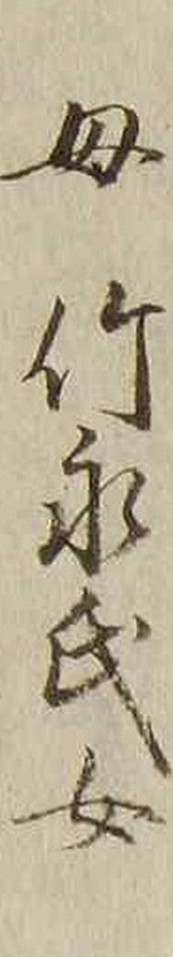母竹永氏女
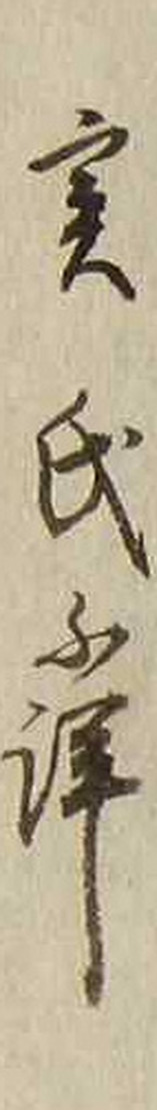実氏不詳

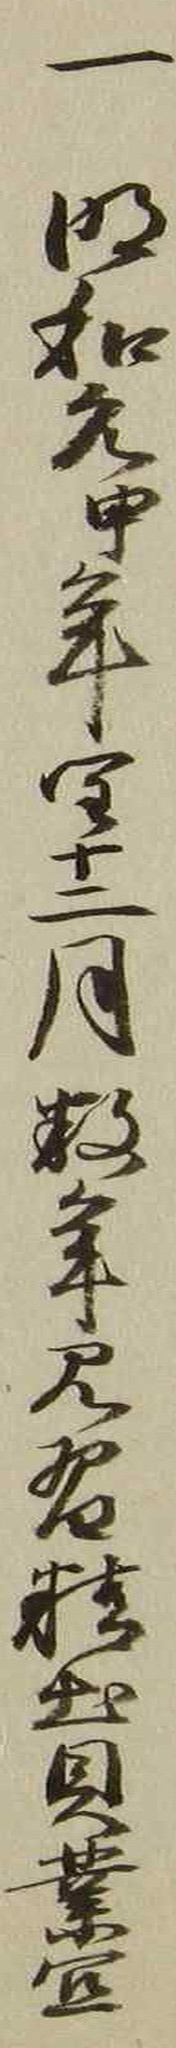一明和元申年閏十二月数年見習精出貝業宜
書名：諸士系譜　巻之102　か之部10
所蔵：会津若松市立会津図書館
